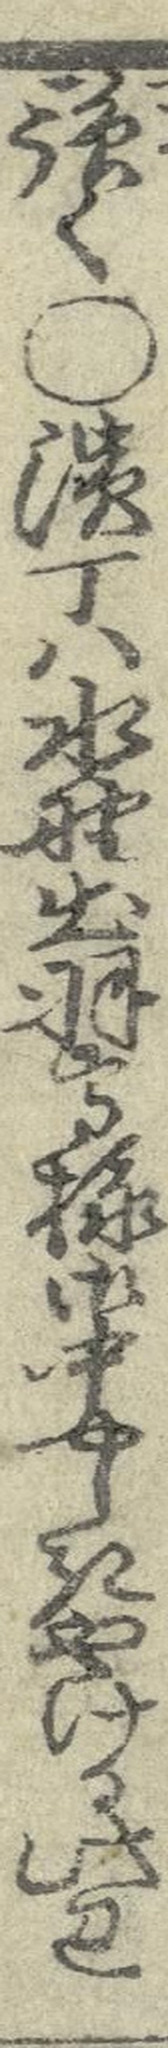強く〇濱丁ハ水野出羽守様御やしきやける此辺
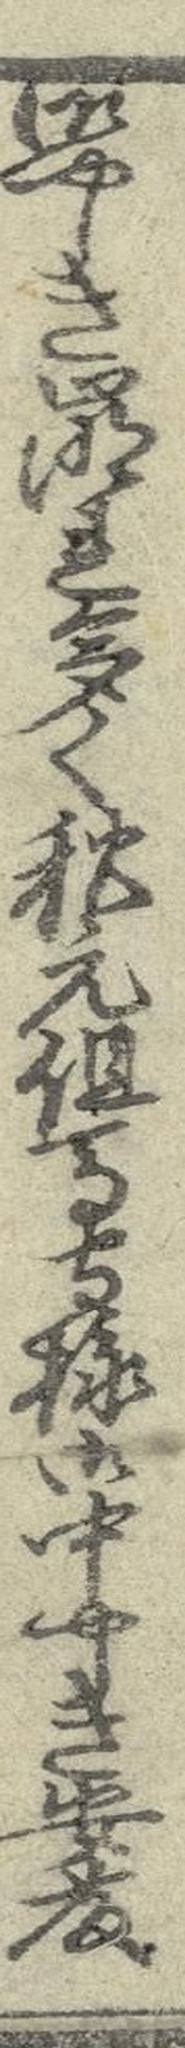御やしき崩れ多く秋元但馬守様御中やしき安藤
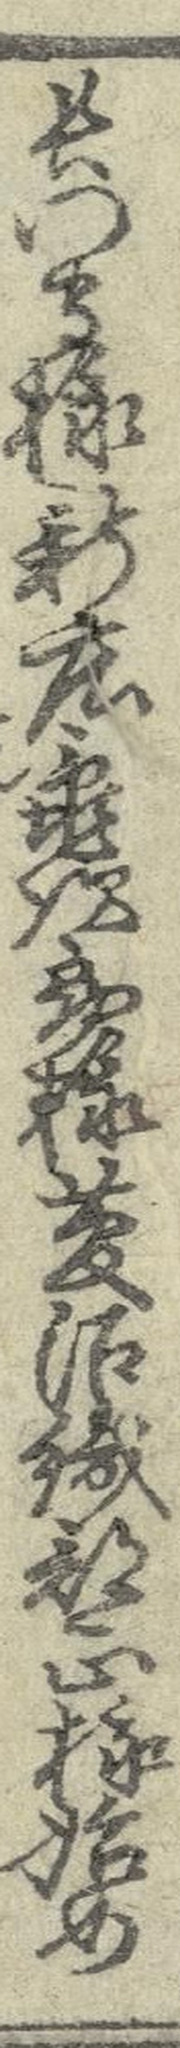長門守様新庄亀次郎様菱沼織部正様始め
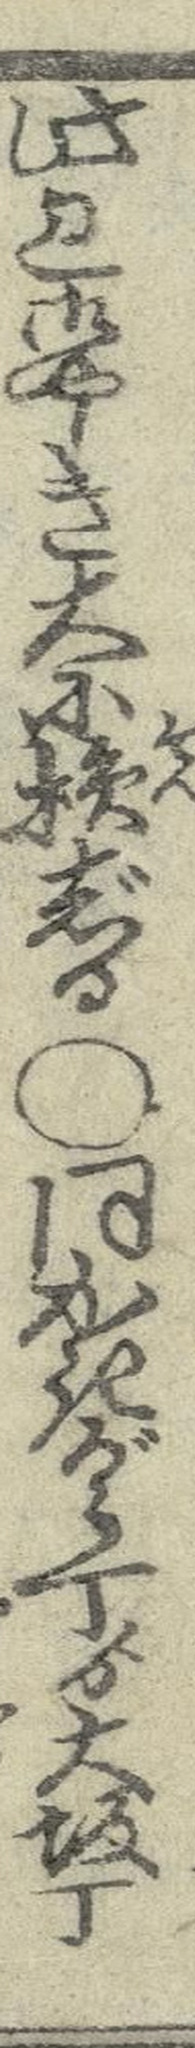此辺御やしき大小損じる〇同かきがら丁ゟ大坂丁
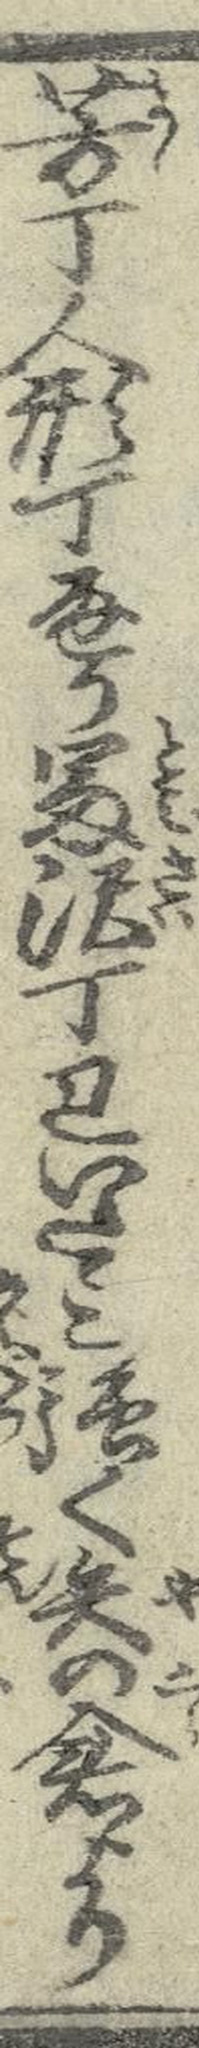芳丁人形丁通り冨沢丁辺いたみ強く矢の倉より
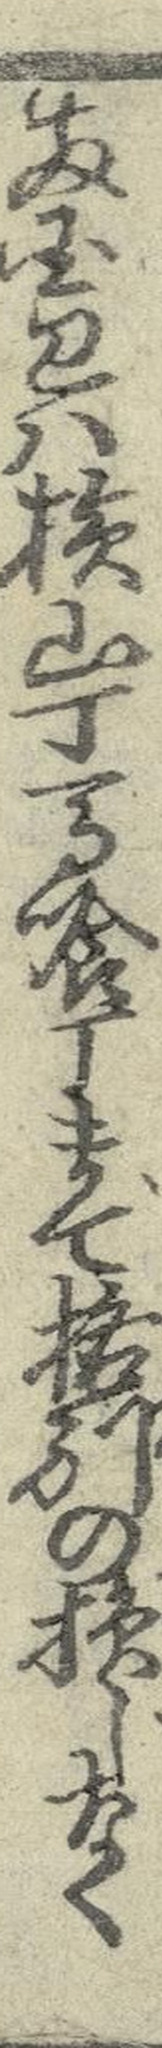両国辺ハ横山丁馬喰丁まで格別の損じなく
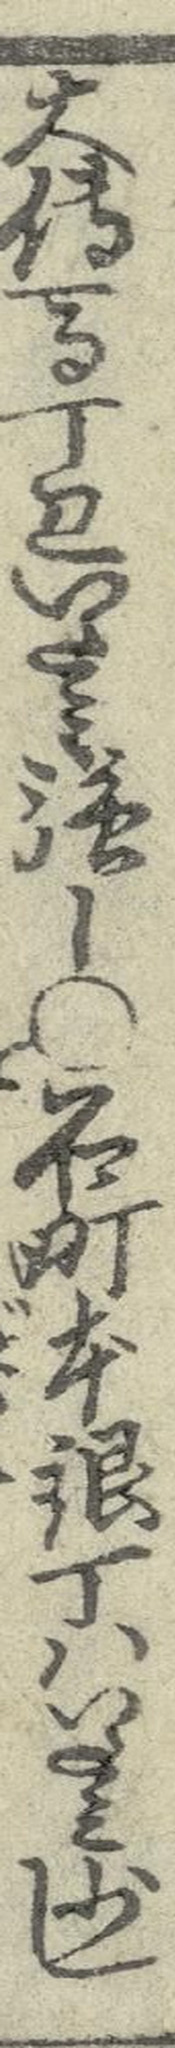大傳馬丁辺いたみ強し〇石町本銀丁ハいたみ少し
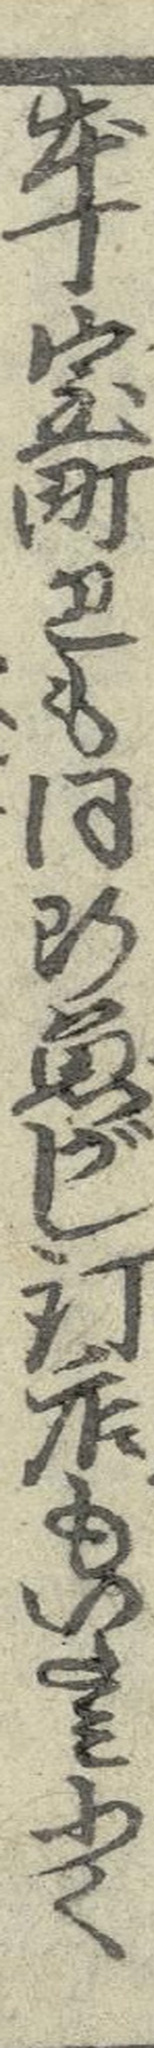本丁宝町辺も同断魚がし釘店もいたみ少く
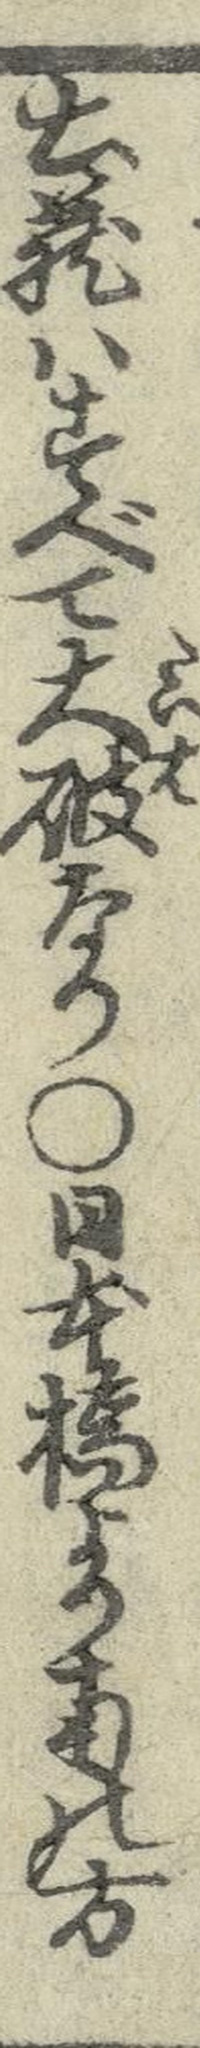土蔵ハすべて大破なり〇日本橋より南の方
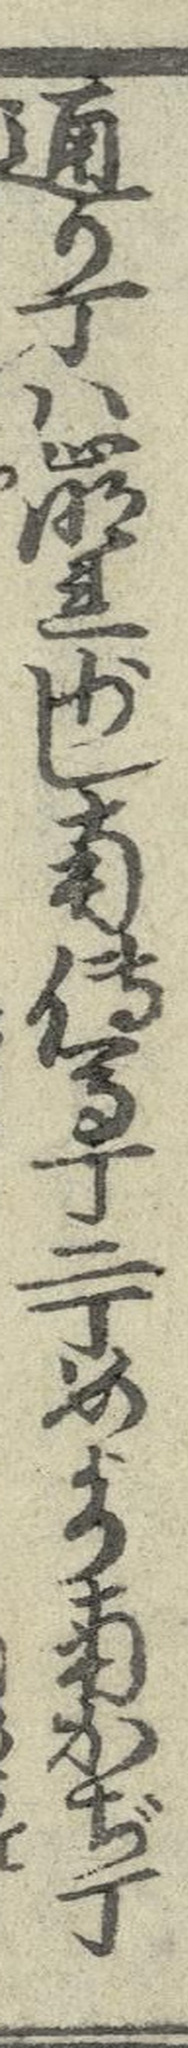通り丁ハ崩れ少し南傳馬丁二丁めより南かぢ丁
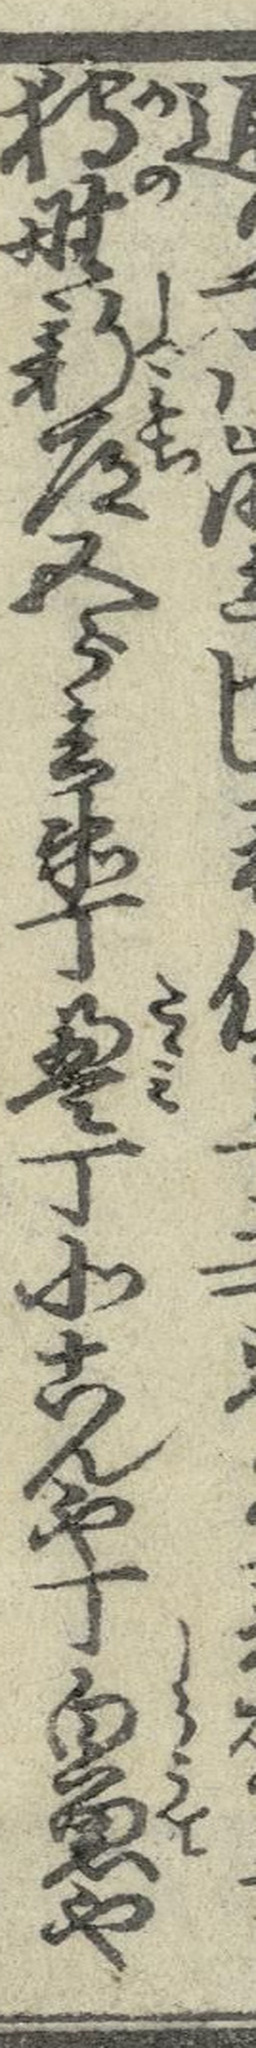狩野新道五郎兵衛丁畳丁北こんや丁白魚や
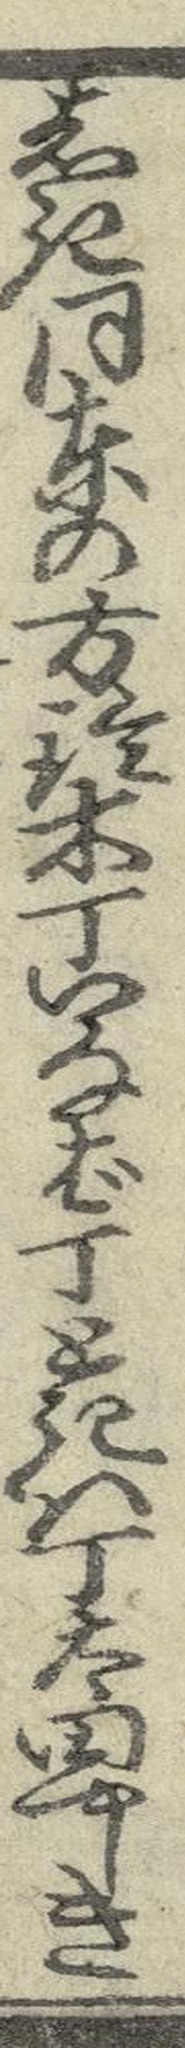しき同東の方鈴木丁いなば丁ときハ丁太田やしき
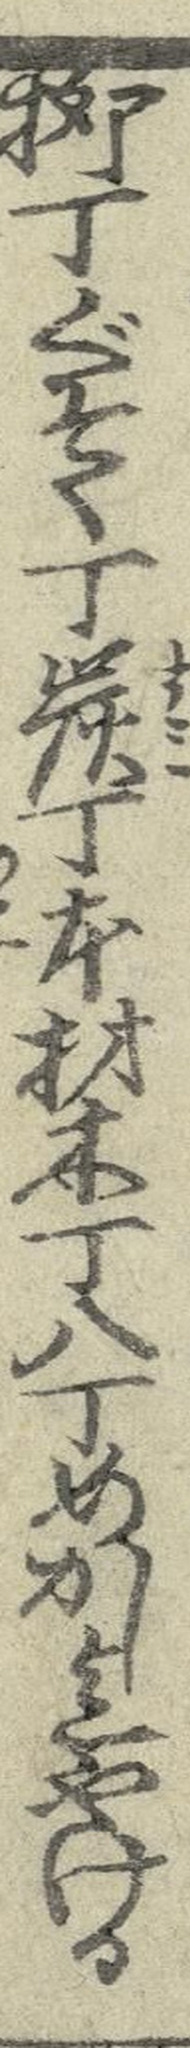柳丁ぐそく丁炭丁本材木丁八丁めかし迄やける
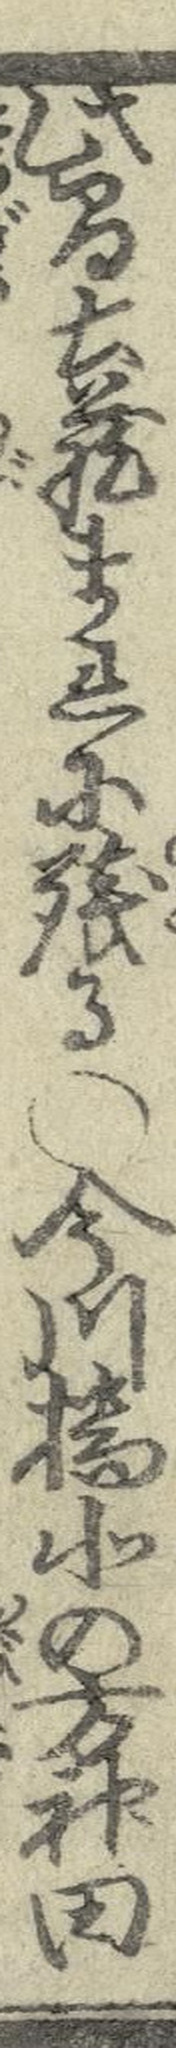此間土蔵まれに残る〇今川橋北の方神田
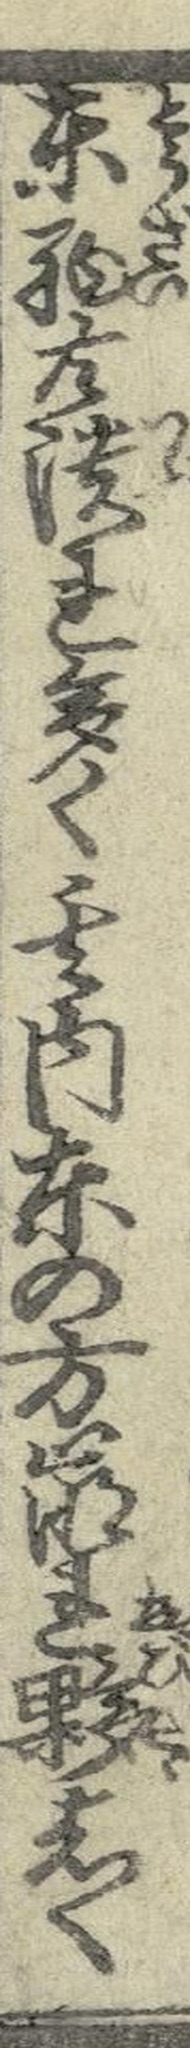東西共潰れ多く其内東の方崩れ夥しく
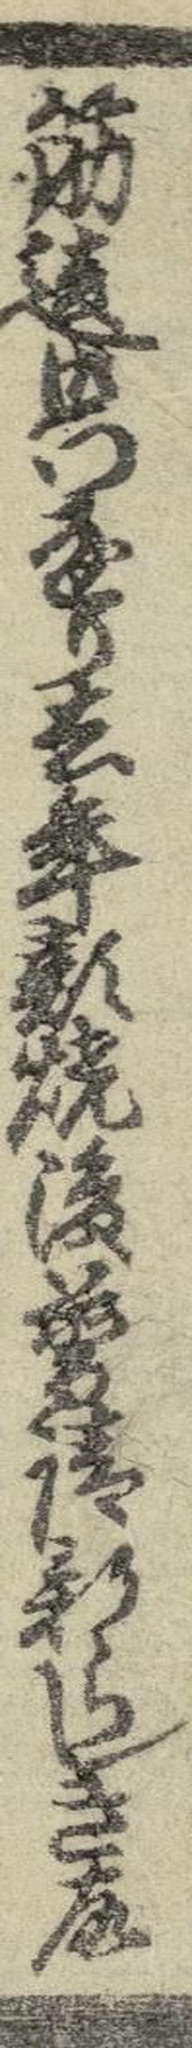筋違御門通り去年類焼後普請新らしき故
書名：地震並出火細見記
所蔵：東京大学地震研究所図書室 Earthquake Research Institute Library, The University of Tokyo, JAPAN
